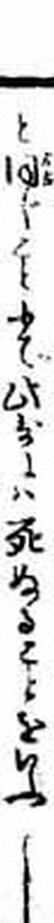と同じことにて此哥には死ぬることをいふ

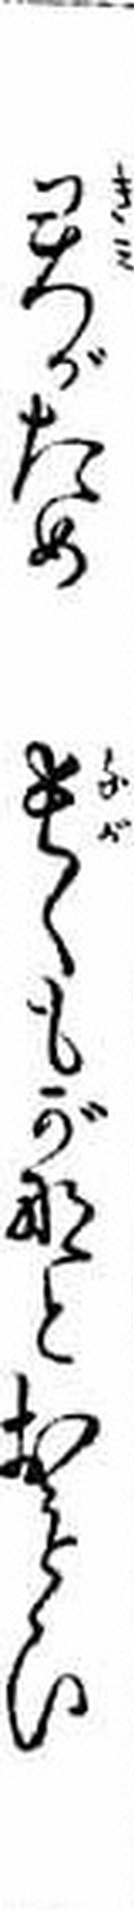君がため長くもがなとおもひ
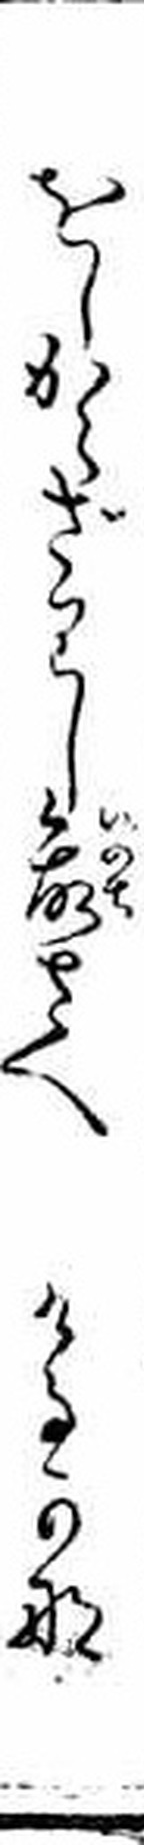をしからざりし命さへけるかな
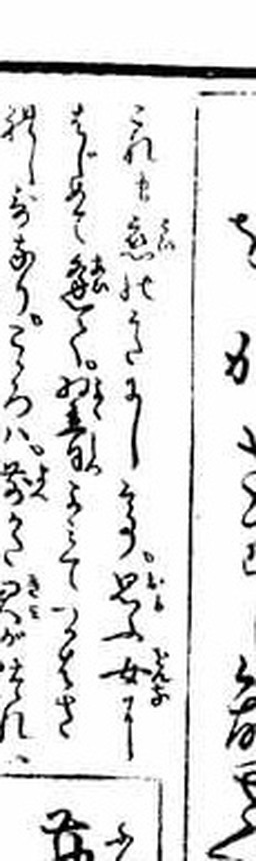これも恋のうたにして思ふ女に
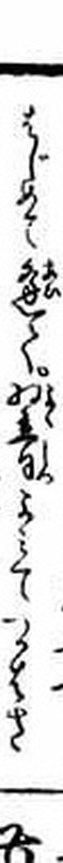はじめて逢て翌日よみてつかはさ藤
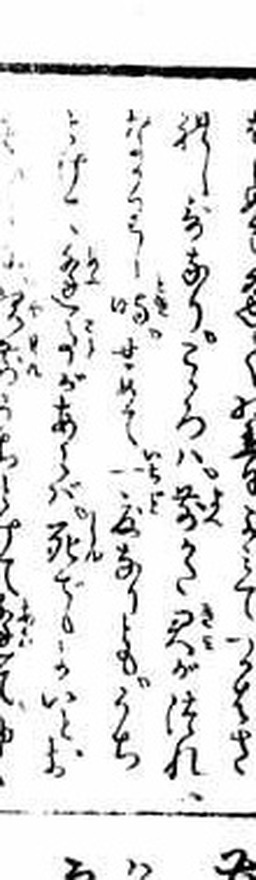なかりし時せめて一度なりともうち
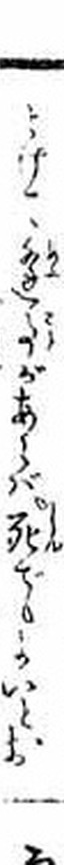とけるて逢があれば死でもよいとお原
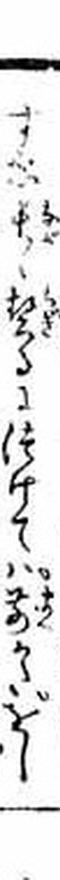すゑ長く契るにつけては前かたをし
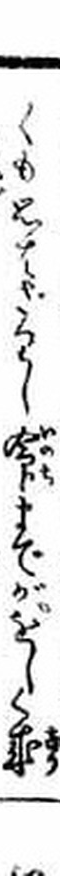くも思はざりし命までがをしく成義
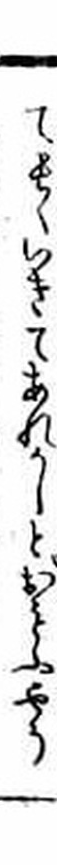て長くいきてあれかしとおもふやう
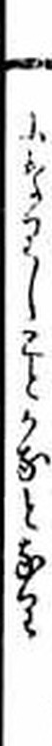になりしことかなとなり孝
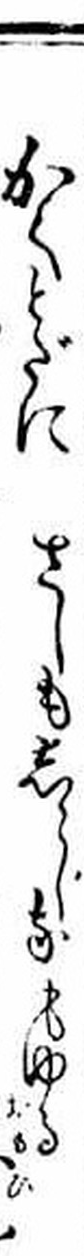かくとだにさしもしらじなもゆる
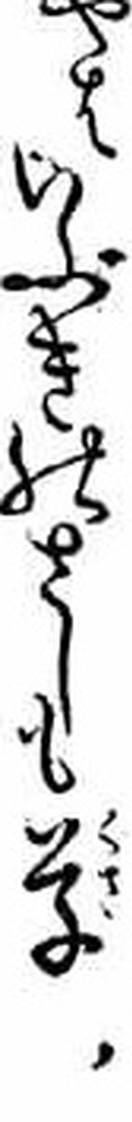いぶきのさしも草
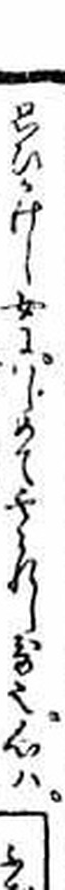思ひかけし女にはじめてやられし哥也心は
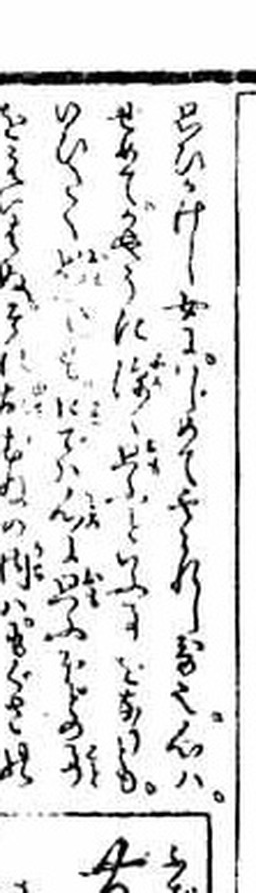せめてかやうに深く思ふといふ事なりとも藤
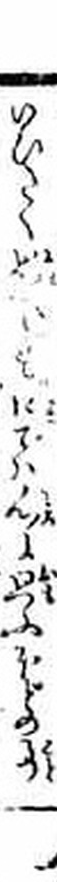いひたく思へども口では心に思ふをどの事原
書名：小倉百人一首
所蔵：東京学芸大学教育コンテンツアーカイブ
